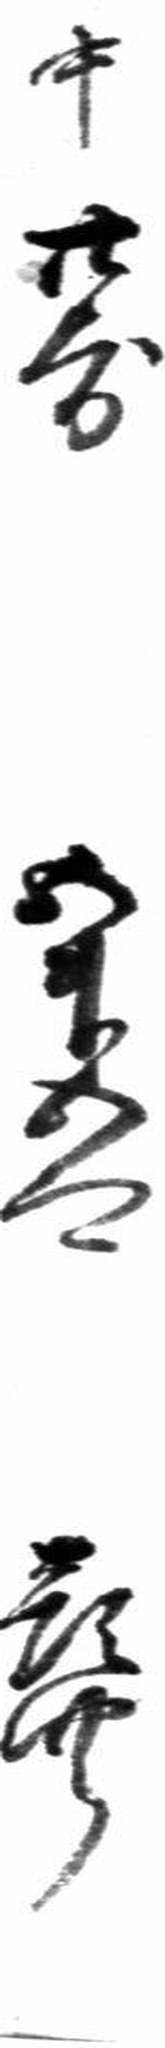中廿歩五升五合彦四郎
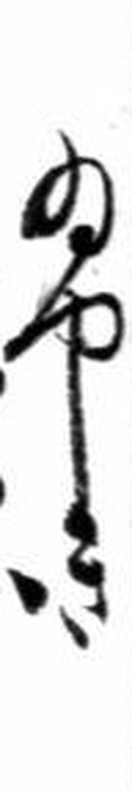ゐやしき
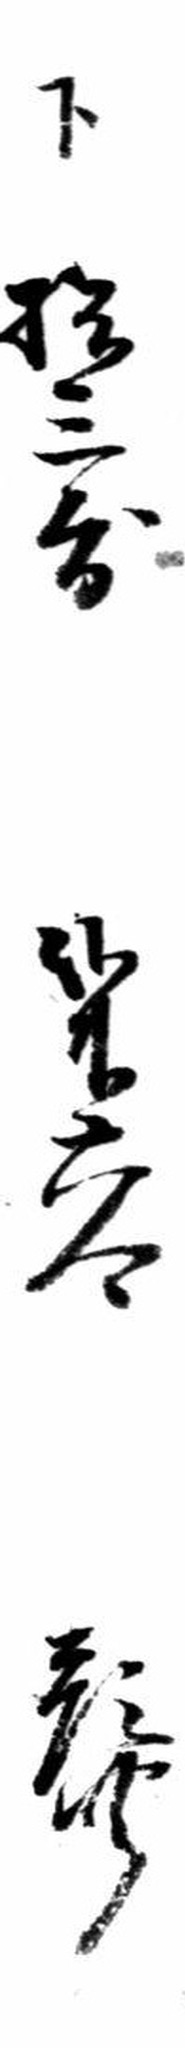下拾三歩弐升六合彦四郎
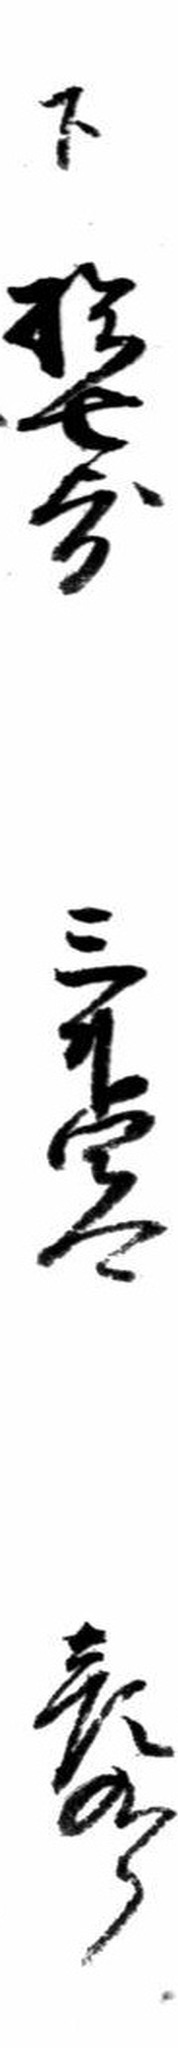下拾七歩三升四合彦九郎
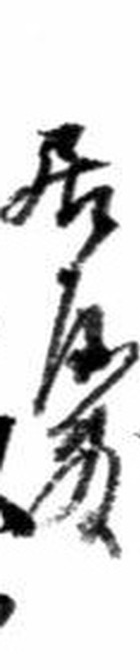居屋敷
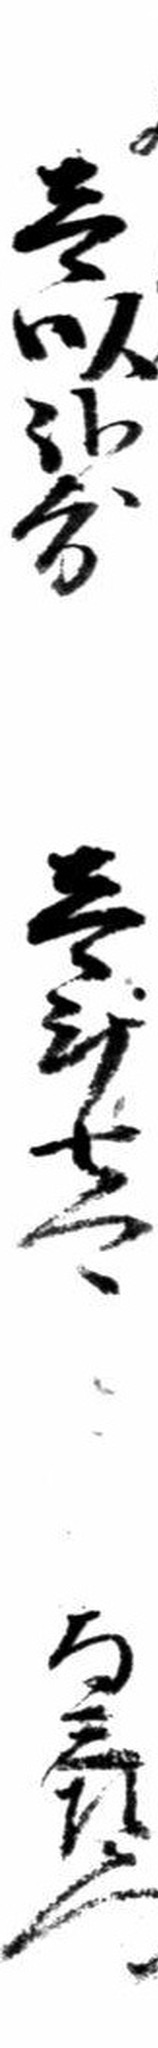壱畝弐歩壱斗七合与三左衛門
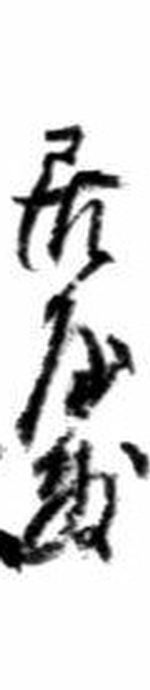居屋敷
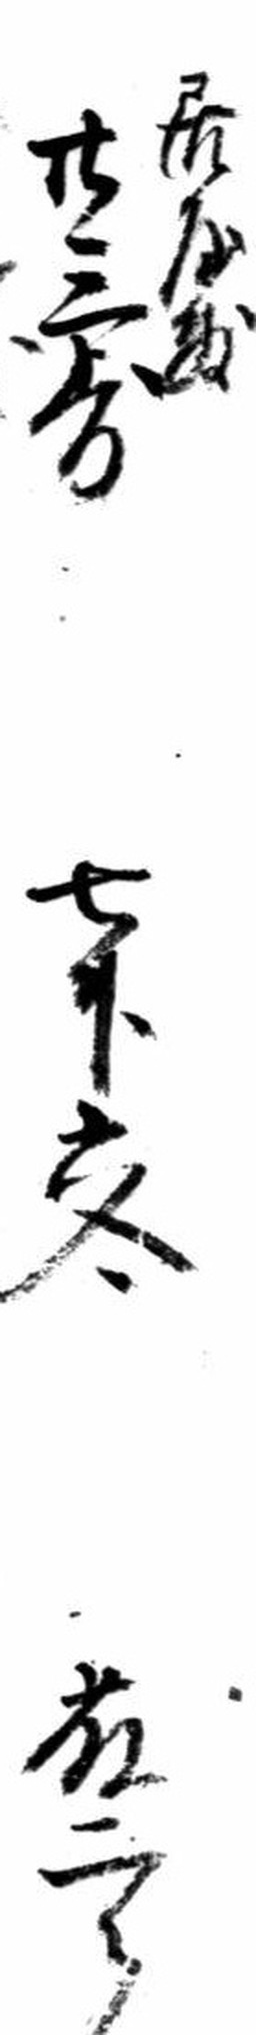廿三歩七升六合藤二郎
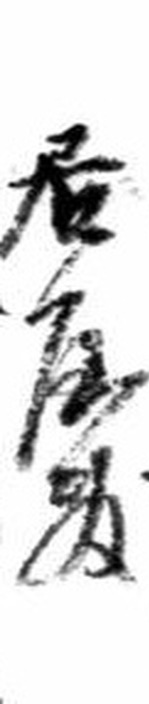居屋敷
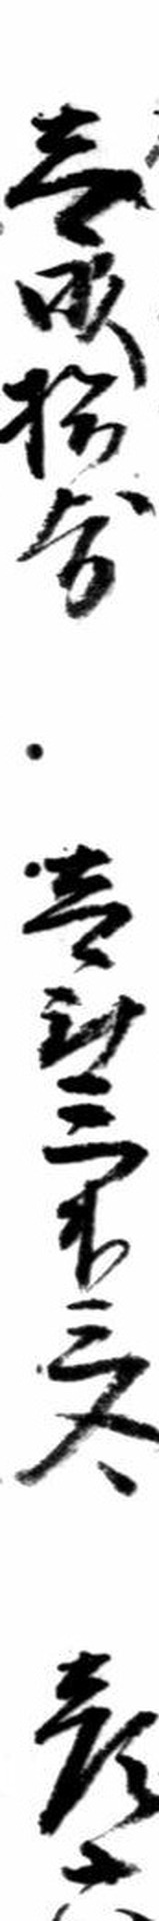壱畝拾歩壱斗三升三合彦六

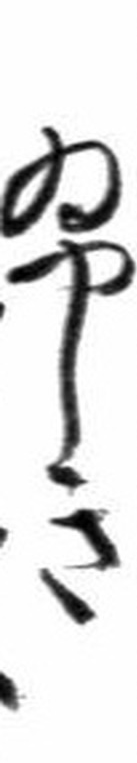ゐやしき
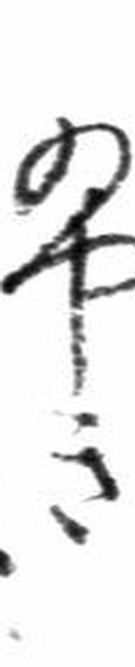ゐやしき
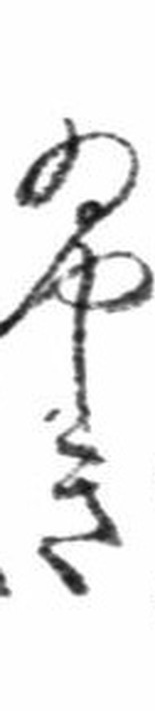ゐやしき
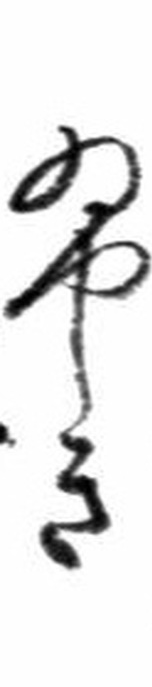ゐやしき
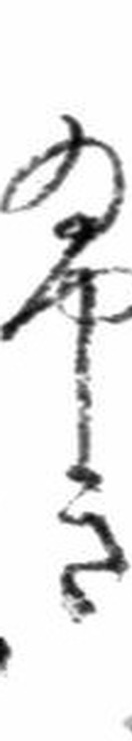ゐやしき
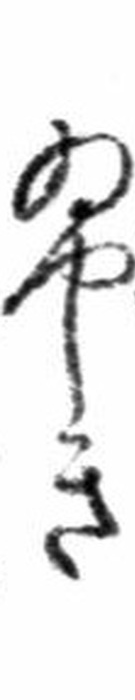ゐやしき
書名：若州三方郡之内世久見浦御検地帳（世久見浦検地帳写）
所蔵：福井県文書館 Fukui Prefectural Archives
